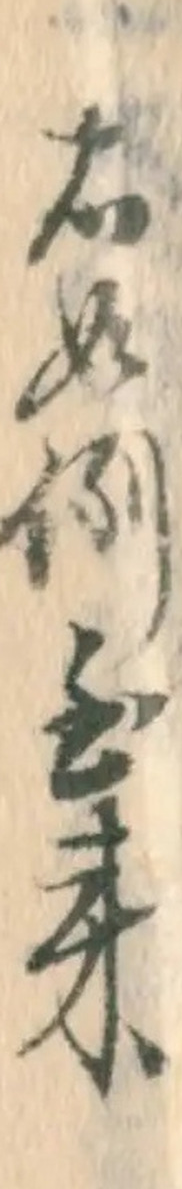右如例到来
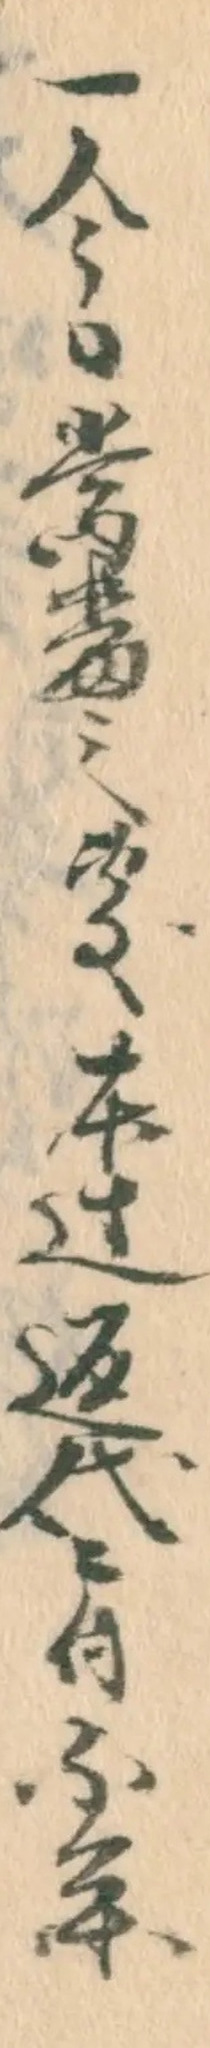一今日当番之処東辻返代ニ付不参
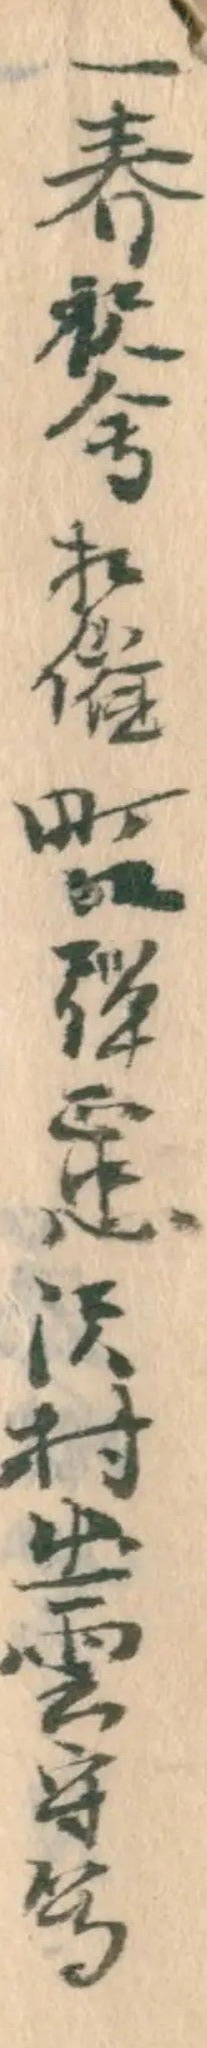一春祝会相催町口弾正忠沢村出雲守等
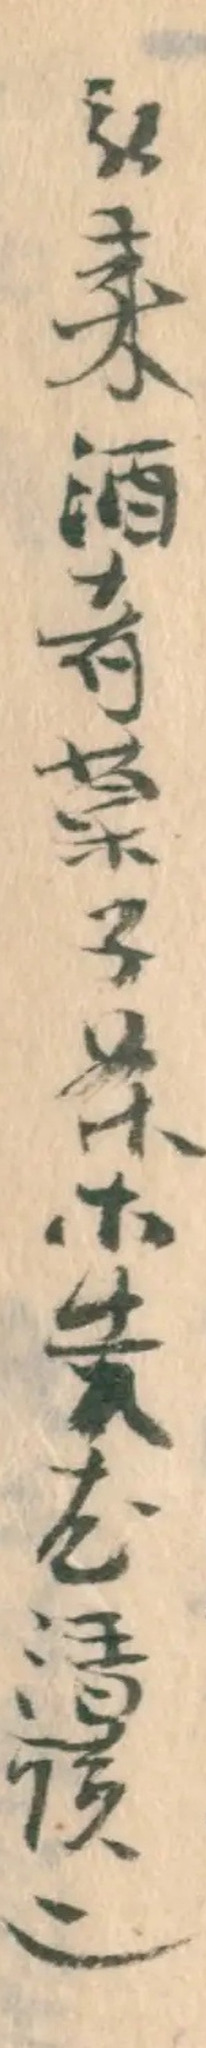被来酒肴菓子茶等出ス尤清夜也
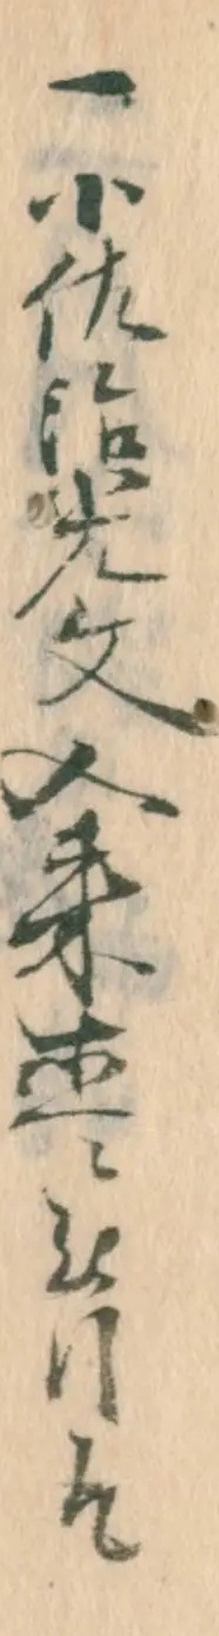一小佐治光文入来直ニ被引取
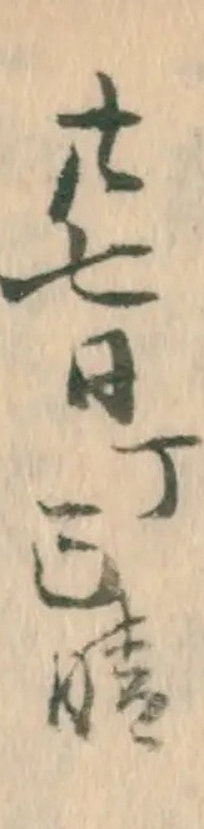廿七日丁巳晴
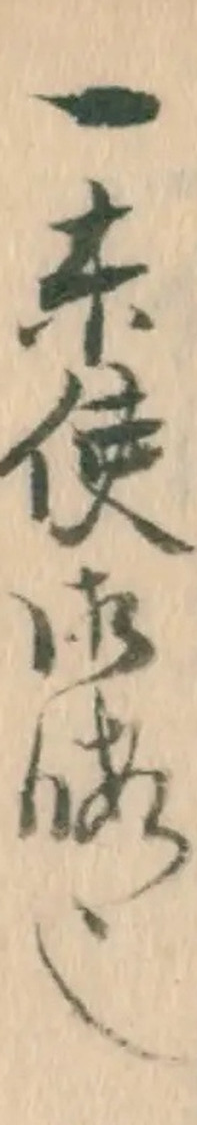一東使御暇也
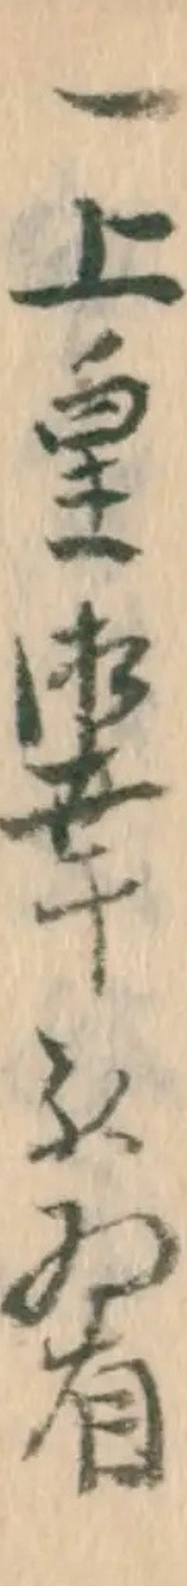一上皇御幸被為有
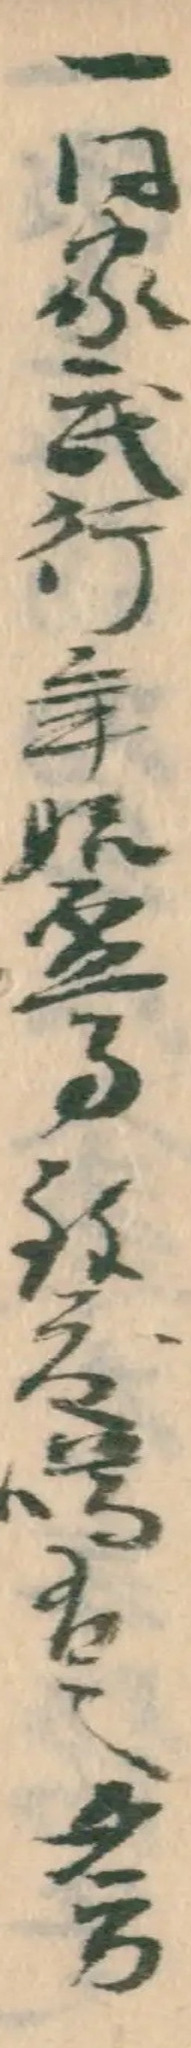一同家武行年始盃事致度噂有之夕方
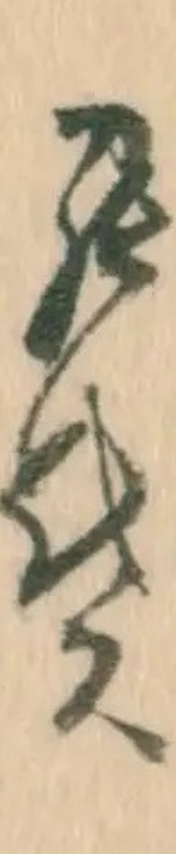罷越ス
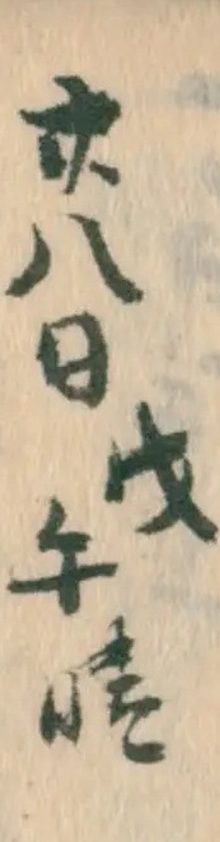廿八日戊午晴
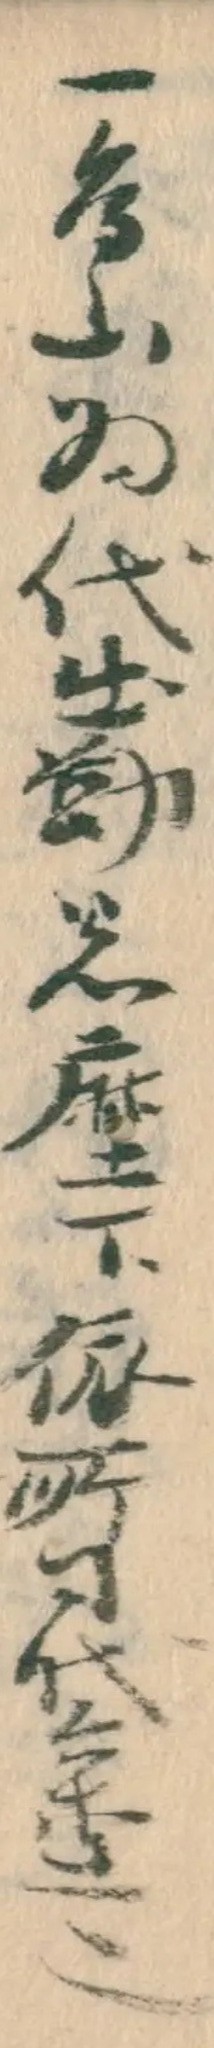一鳥山為代出勤着麻上下依所司代参上也
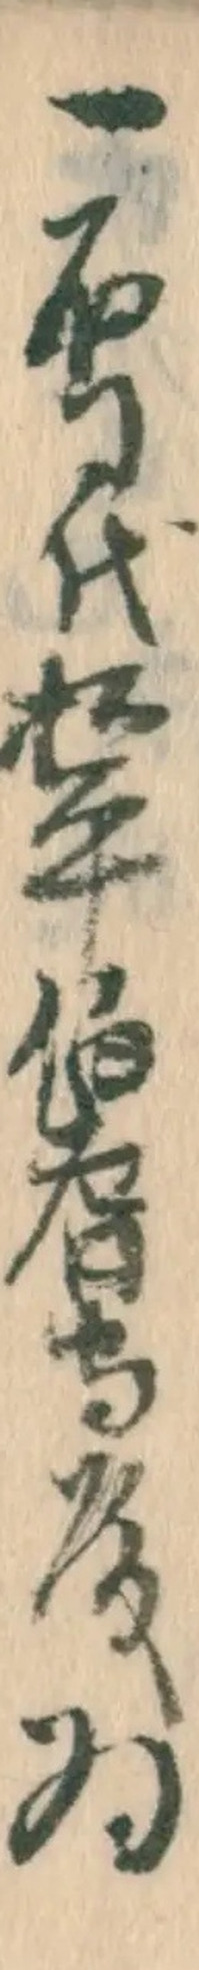一所司代松平伯耆守殿へ為
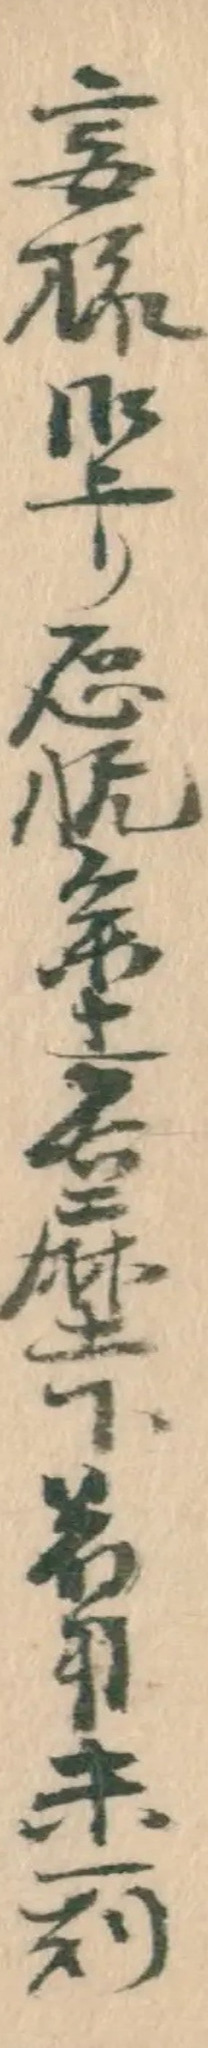宮様御上り恐悦参上各麻上下着用未一刻
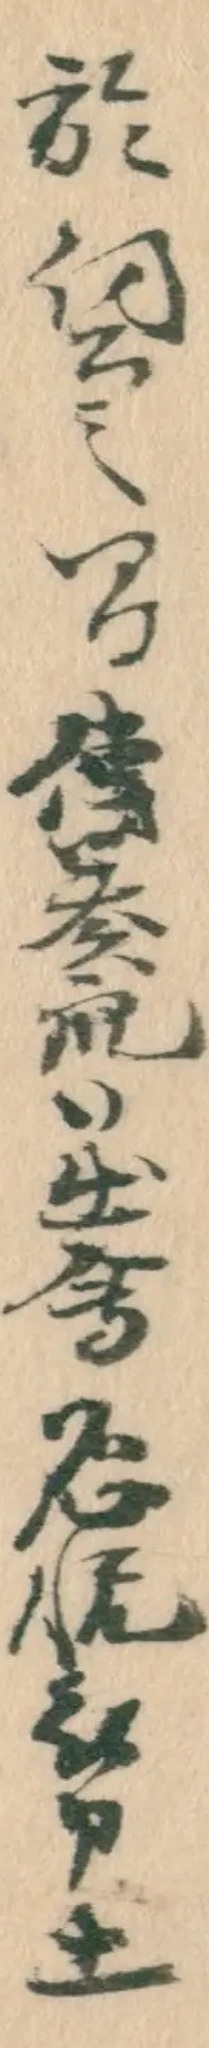於伺公之間伝奏衆御出会恐悦被申上
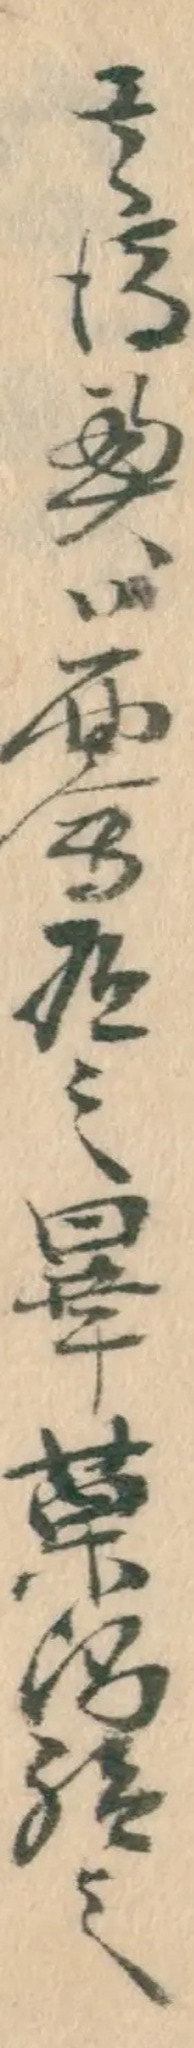其後奥御面会有之畢菓酒給之
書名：禁裏御所御用日記. [131]
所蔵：国立国会図書館 National Diet Library, JAPAN
